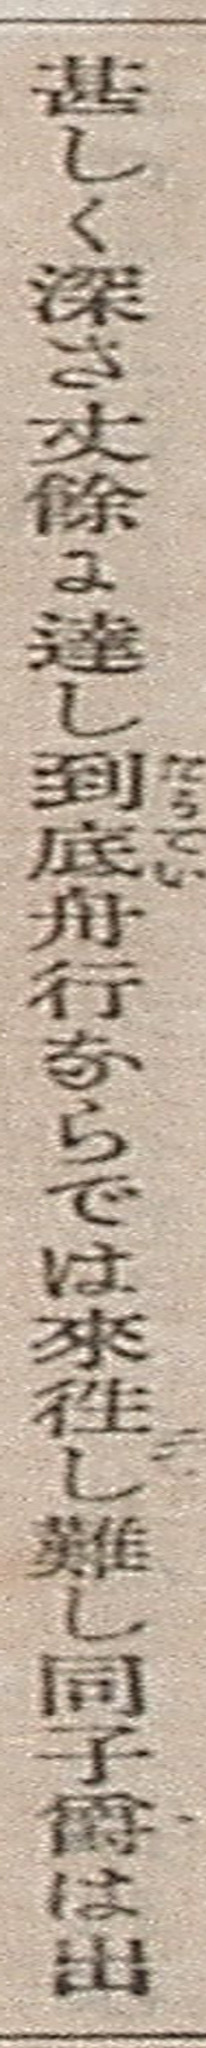甚しく深さ丈余に達し到底舟行ならでは来往し難し同子爵は出
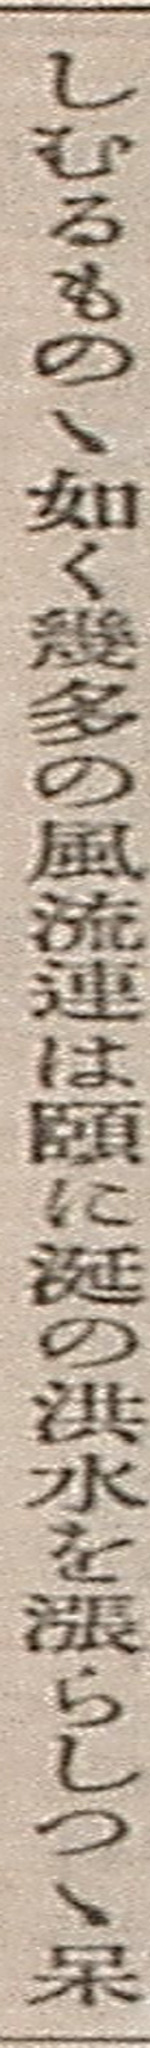しむるものゝ如く幾多の風流連は頤に涎の洪水を漲らしつゝ呆
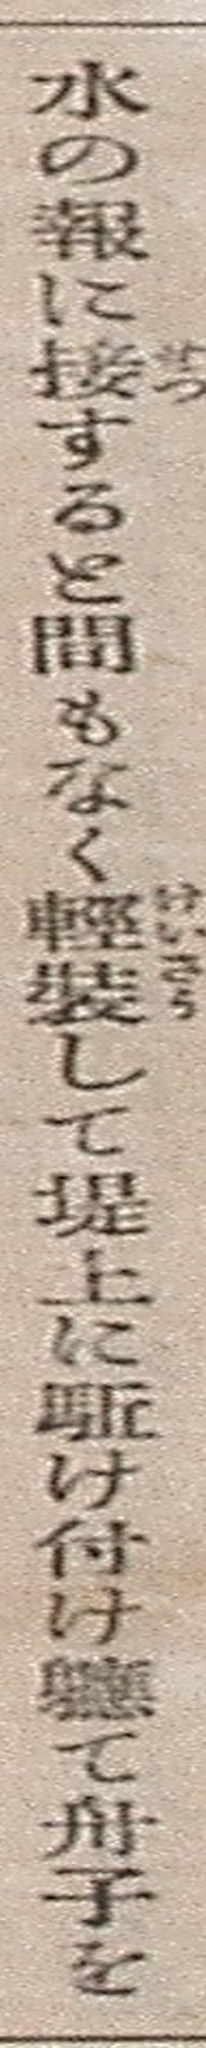水の報に接すると間もなく軽装して堤上に駈け付け軈て舟子を
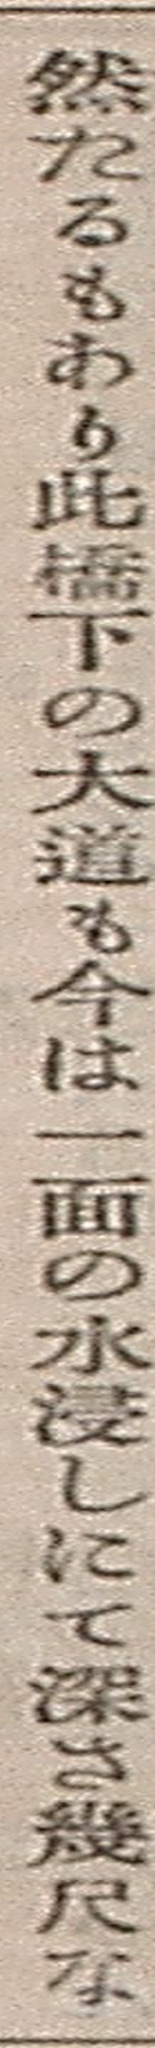然たるもあり此橋下の大道も今は一面の水浸しにて深さ幾尺な
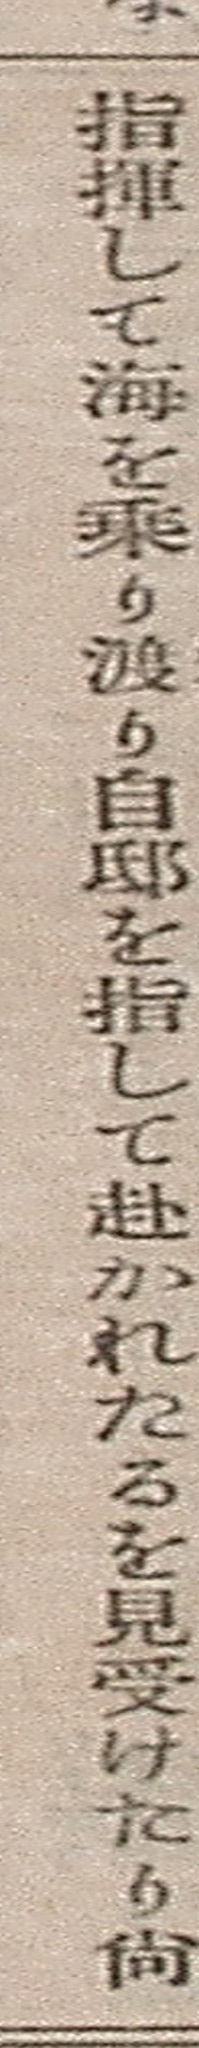指揮して海を乗り渡り自邸を指して赴かれたるを見受けたり尚
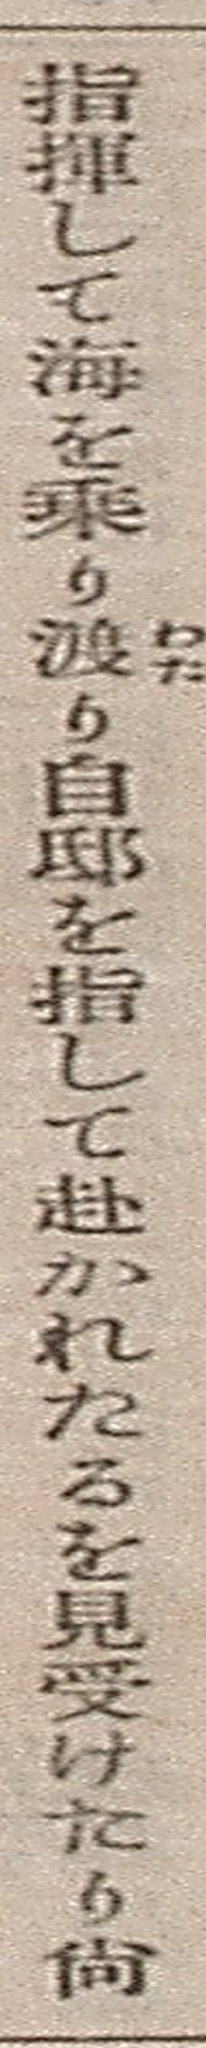指揮して海を乗り渡り自邸を指して赴かれたるを見受けたり尚
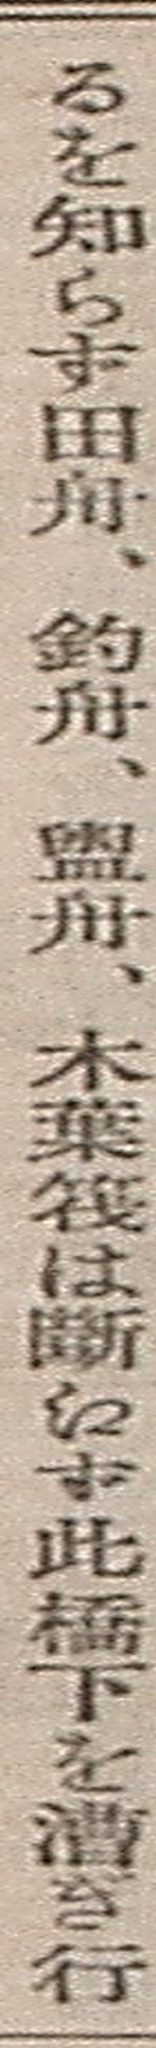るを知らず田舟、釣舟、盥舟、木葉筏は断えず此橋下を漕ぎ行
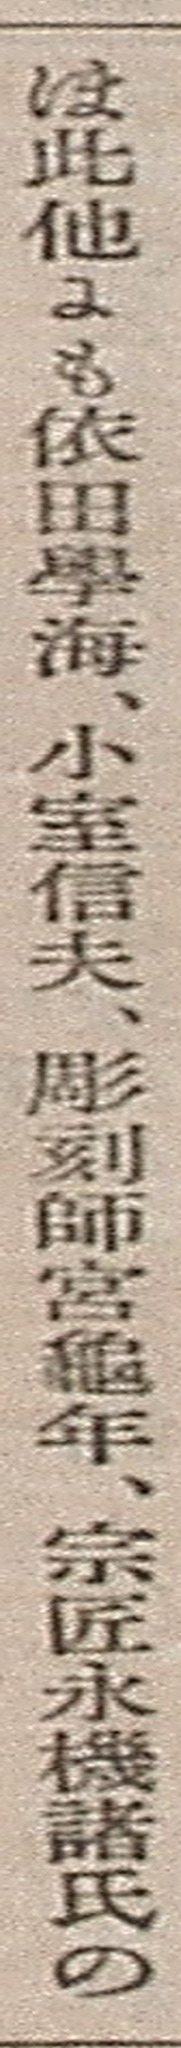ほ此他にも依田学海、小室信夫、彫刻師宮亀年、宗匠永機諸氏の
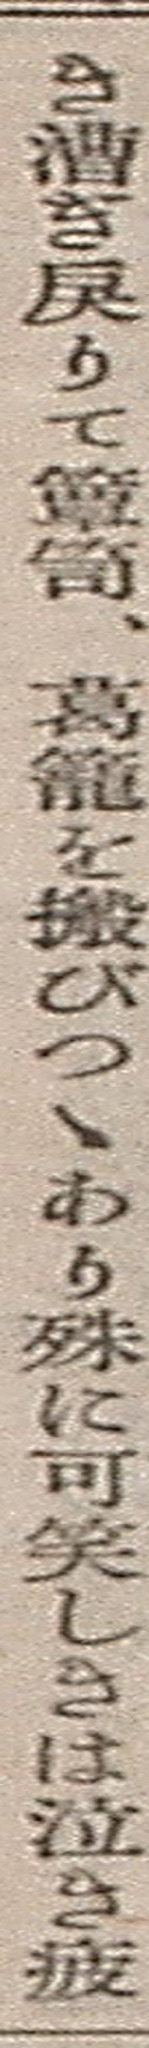き漕ぎ戻りて箪笥、葛籠を搬びつゝあり殊に可笑しきは泣き疲
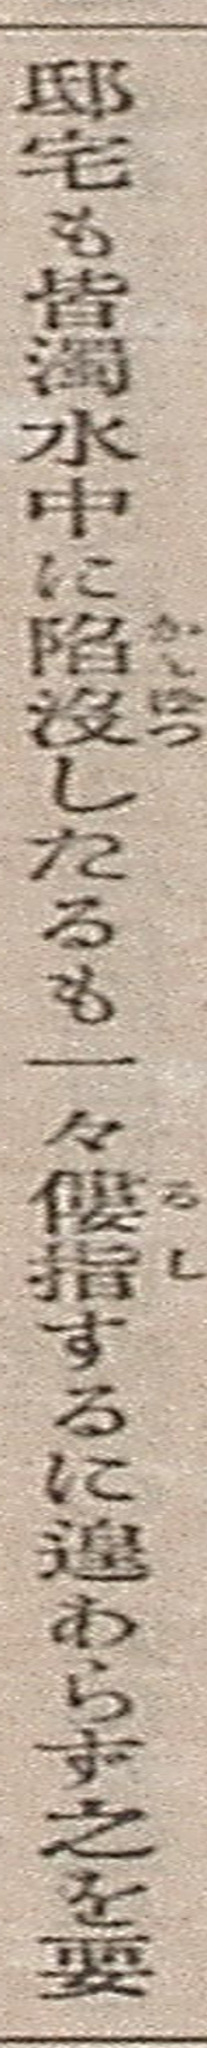邸宅も皆濁水中に陥没したるも一々僂指するに遑あらず之を要
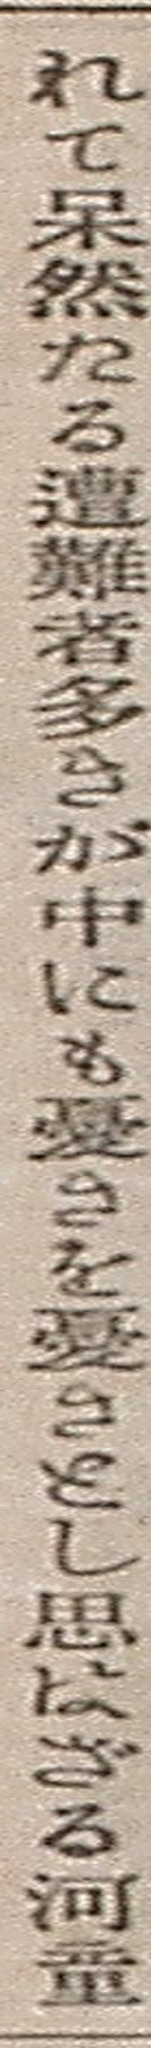れて呆然たる遭難者多きが中にも憂きを憂きとし思はざる河童
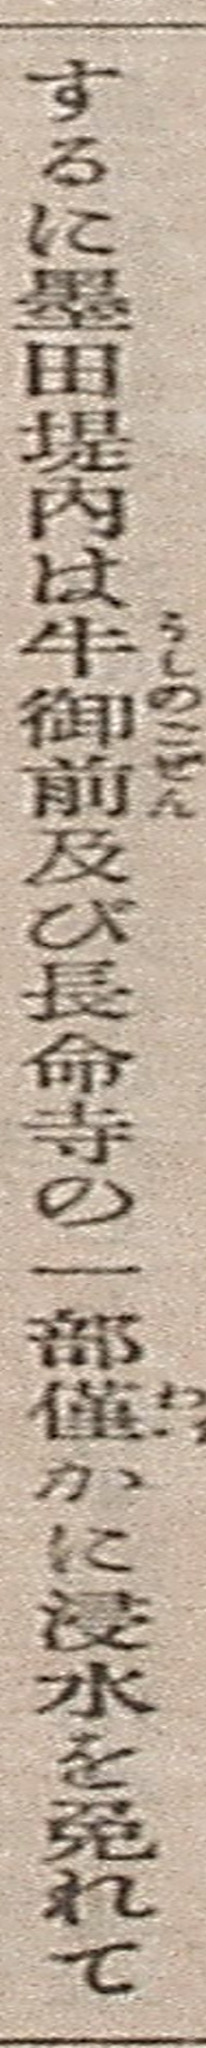するに隅田堤内は牛御前及び長命寺の一部僅かに浸水を免れて
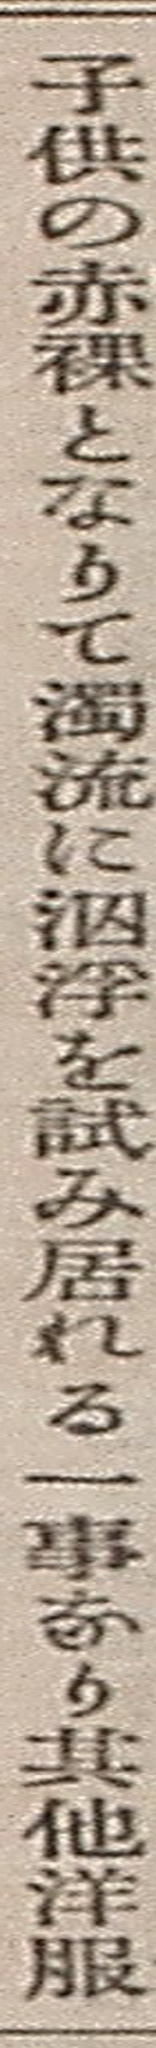子供の赤裸となりて濁流を泅浮を試み居れる一事なり其他洋服
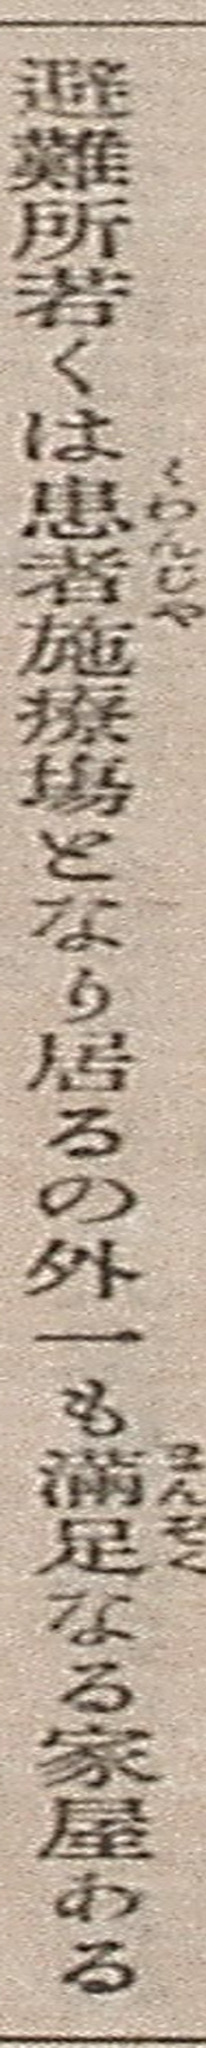避難所若くは患者施療場となり居るの外一も満足なる家屋ある
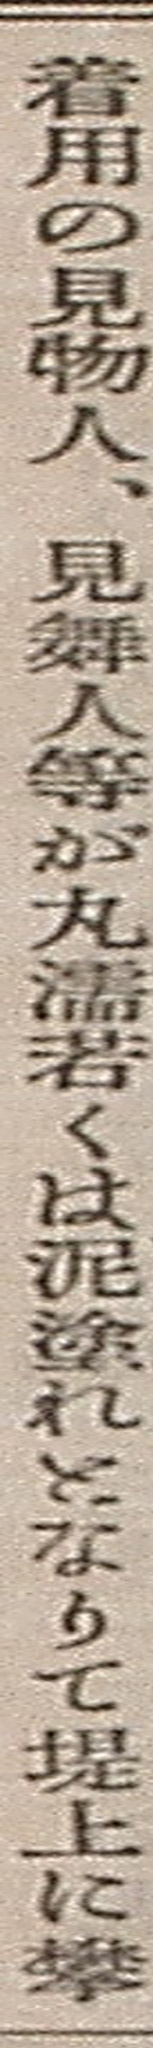着用の見物人、見舞人等が丸濡若くは泥塗れとなりて堤上に攀
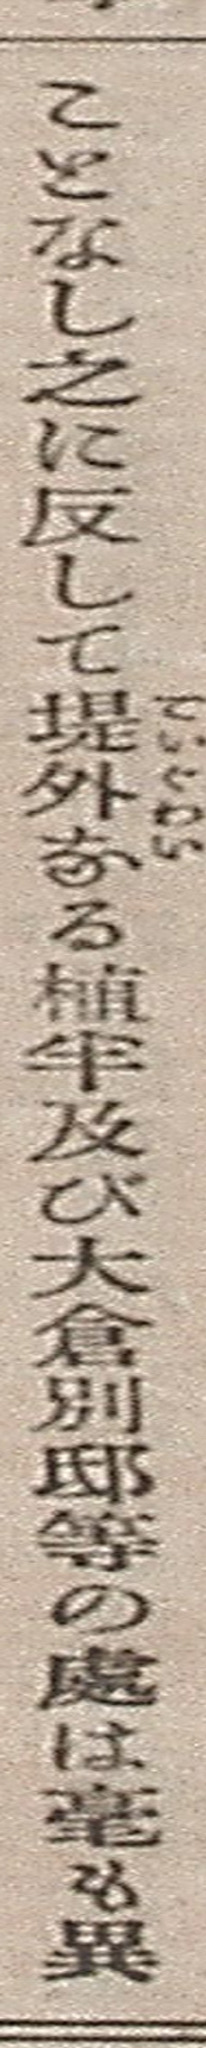ことなし之に反して堤外なる植半及び大倉別邸等の処は毫も異
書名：風俗畫報臨時増刊第百二十四號　洪水地震被害録（上）
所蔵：東京大学地震研究所図書室 Earthquake Research Institute Library, The University of Tokyo, JAPAN
